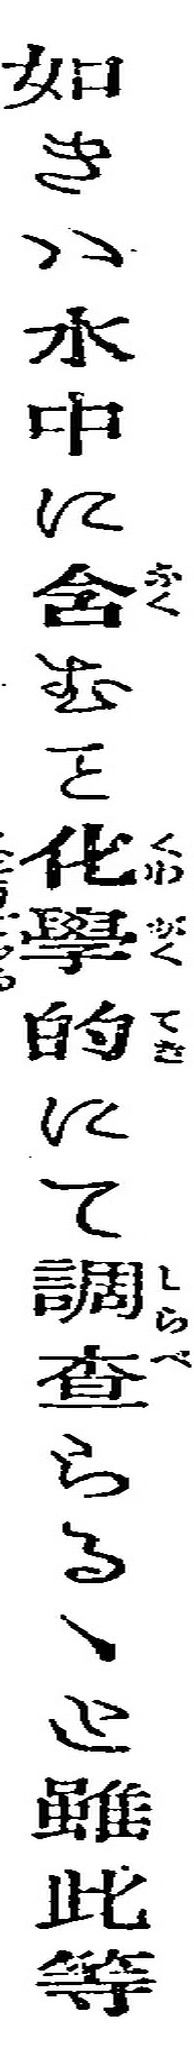如きは水中に含むこと化学的にて調査らるゝと雖此等
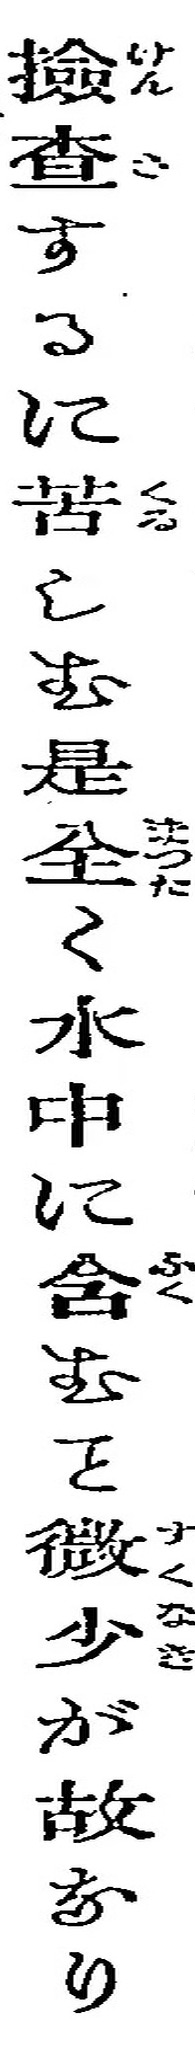検査するに苦しむ是全く水中に含むこと微小が故なり
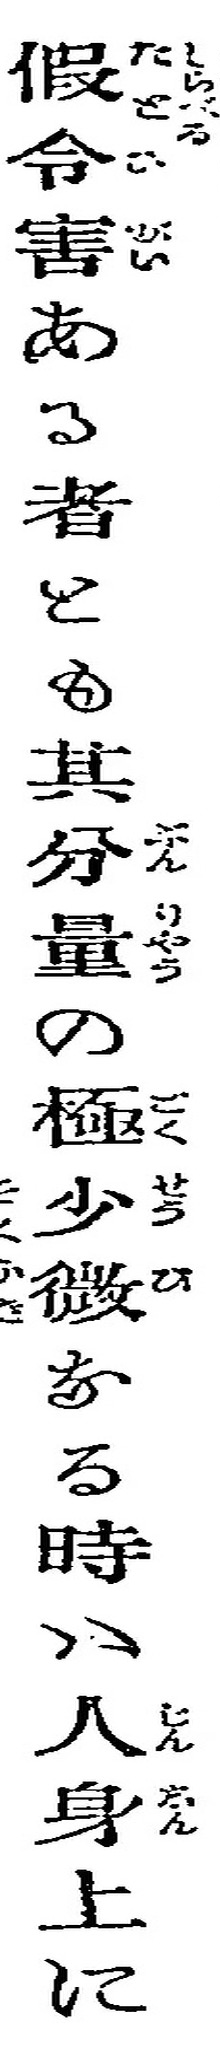假令害ある者とも其分量の極少微なる時は人身上に
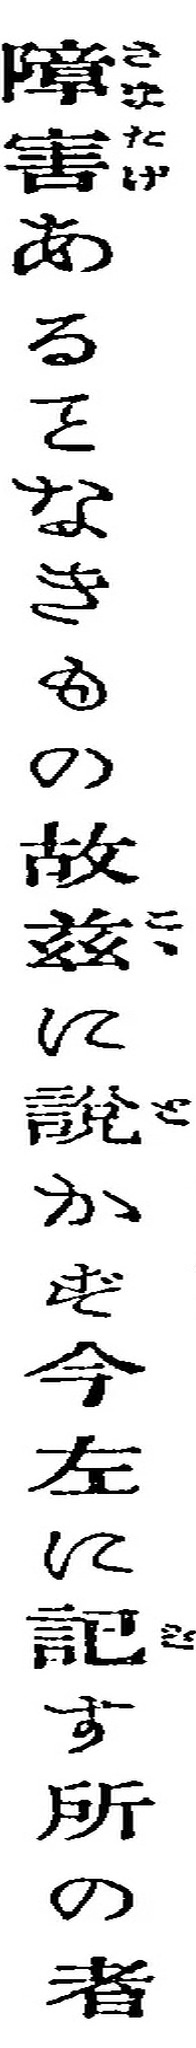障害あることなきもの故茲に説かず今左に記る所の者
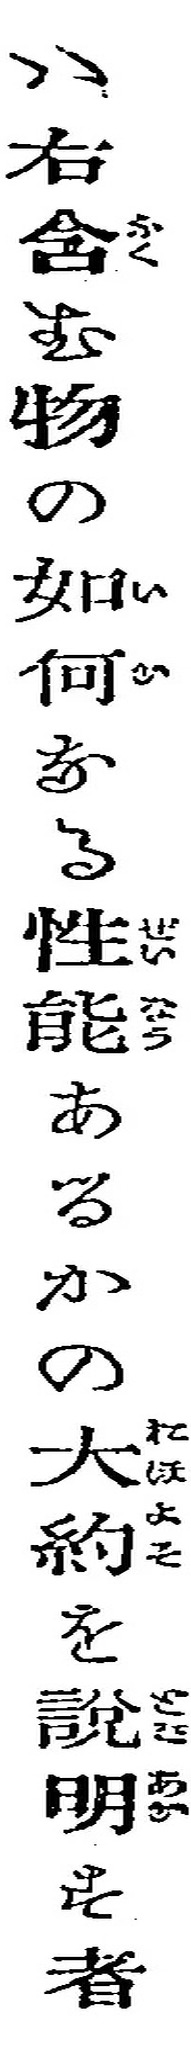は右含む物の如何なるなる性能あるかの大約を説明す者
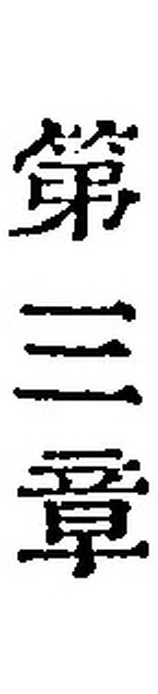第三章
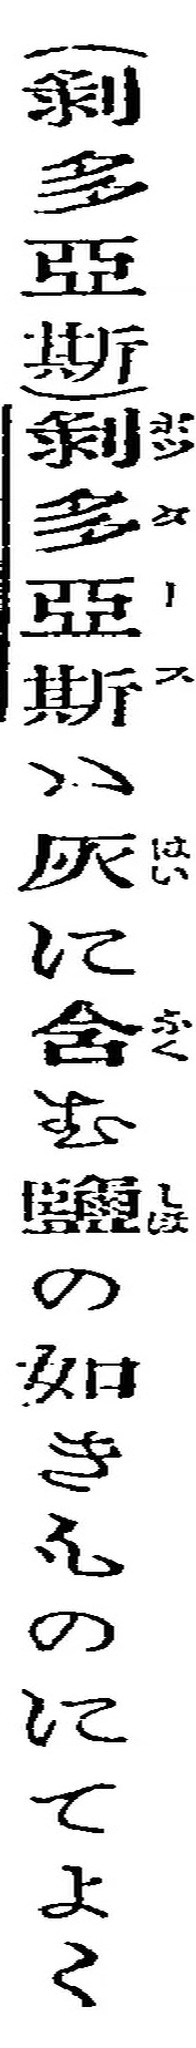[剥多亞斯]剥多亞斯は灰に含む鹽の如きものにてよく
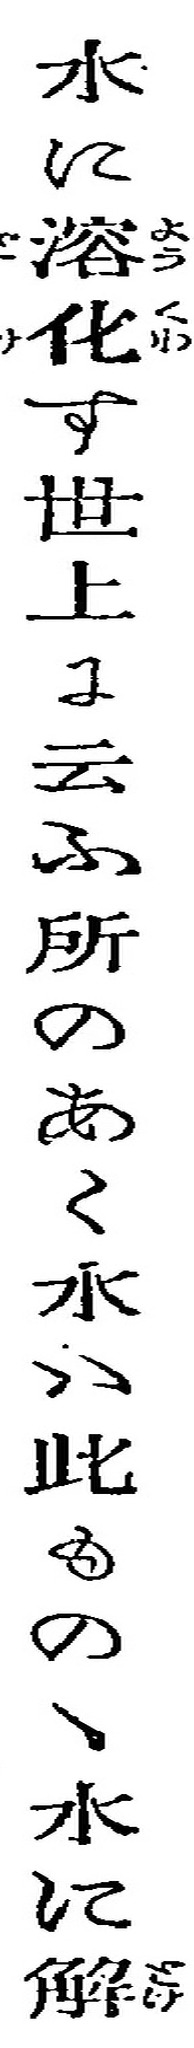水に溶化す世上に云う所のあく水は此ものゝ水に解
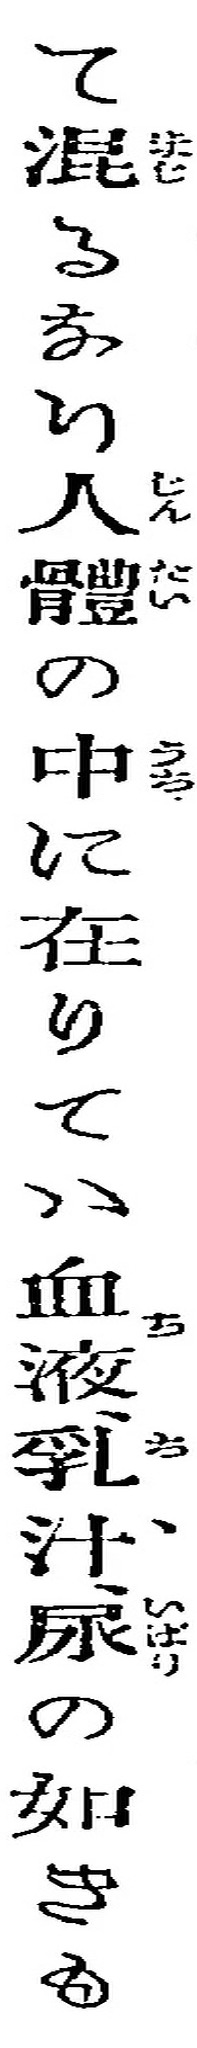て混るな人體の中に在りては血液、乳、汁、尿の如きも
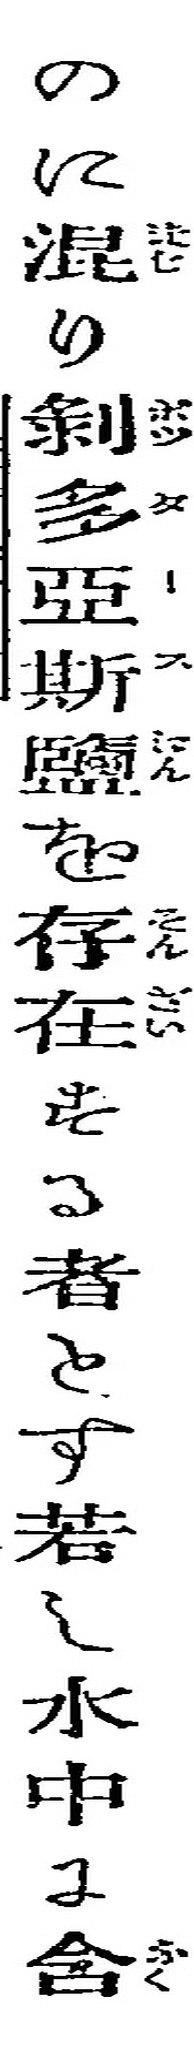のに混り剥多亞斯鹽を存在する者とす若し水中に含
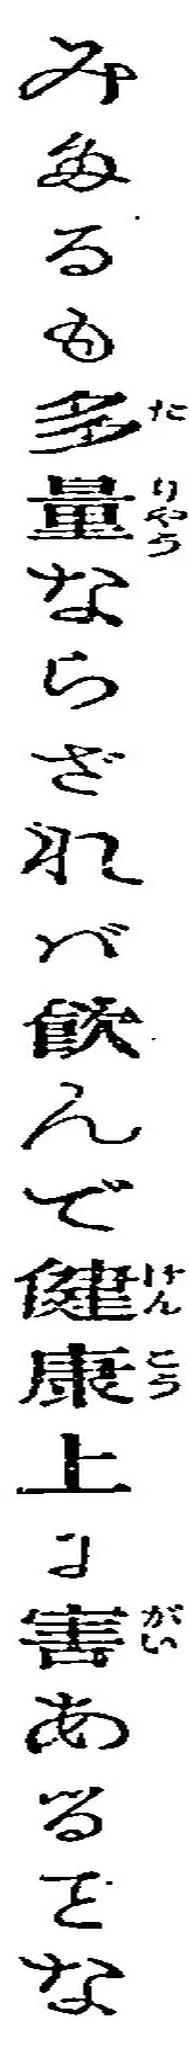みたるも多量ならざれば飲んで健康上に害あることな
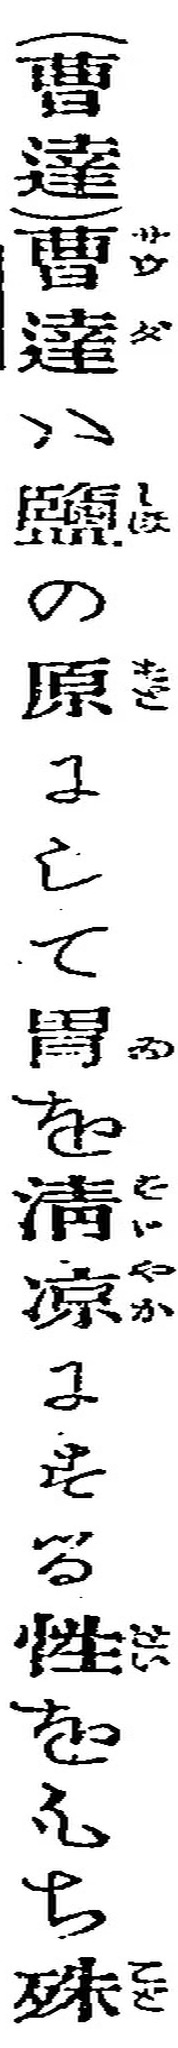[曹達]曹達は鹽の原にして胃を清涼にする性をもち殊
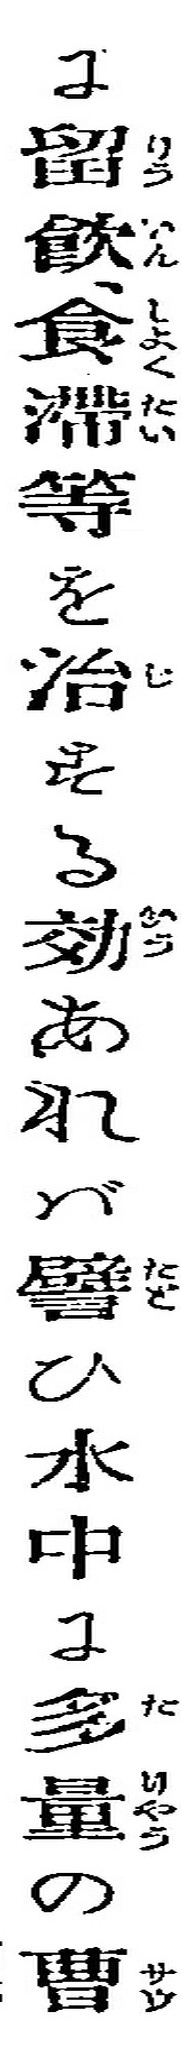に留飲、食滞等を治する効あれば譬ひ水中に多量の曹
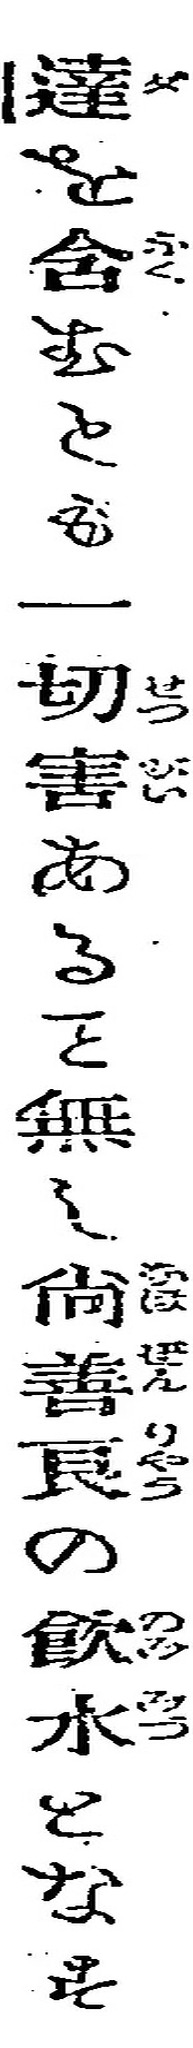達を含むとも一切害あること無し尚善良の飲水となす

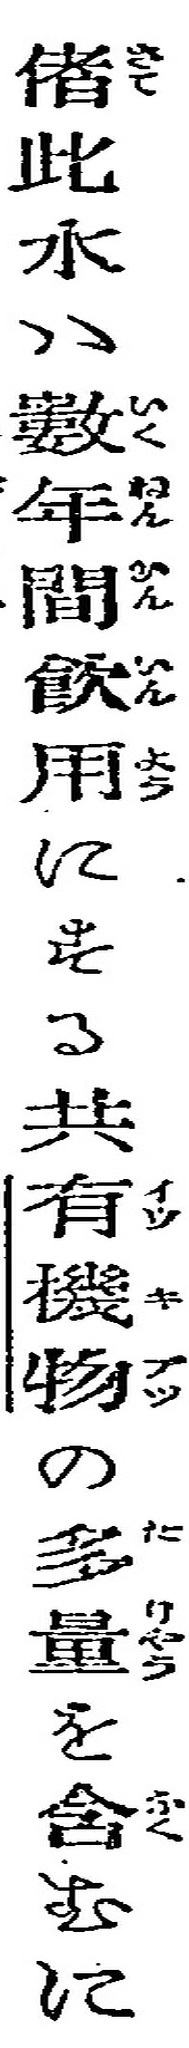偖水は数年間飲用にする共有機物の多量を含むに
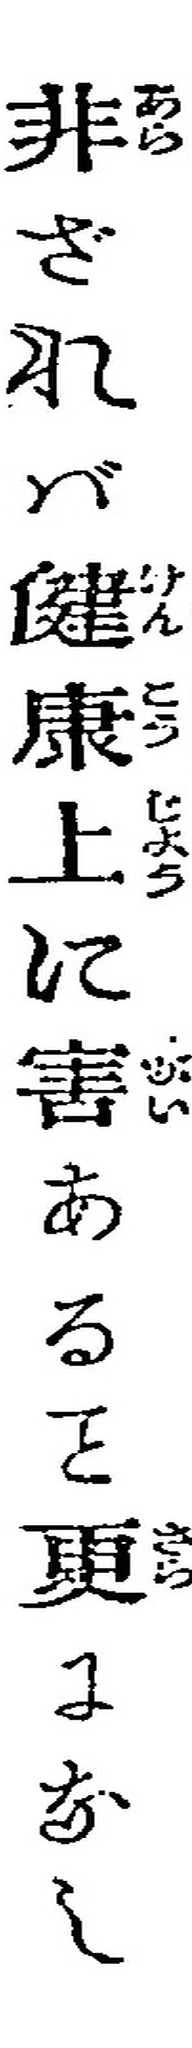非ざれば健康上にあること更になし
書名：飲水の心得 : 伝染病の予防
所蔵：国立国会図書館 National Diet Library, JAPAN
